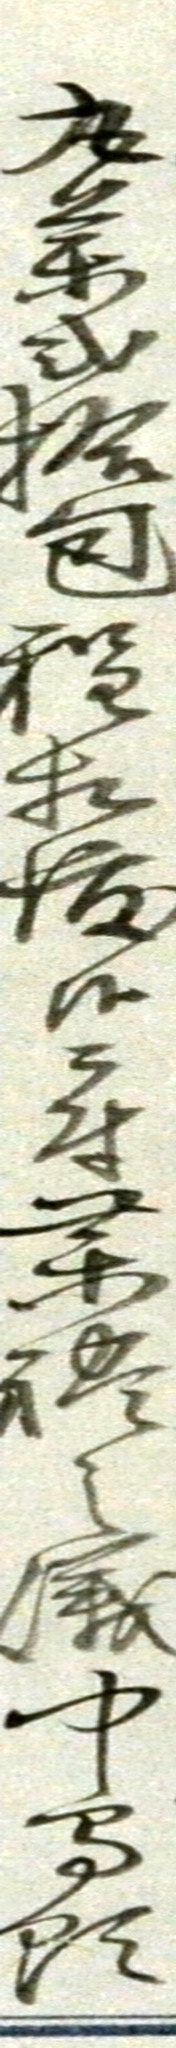丸薬弐拾包程相渡候ニ付薬礼之儀中間頭
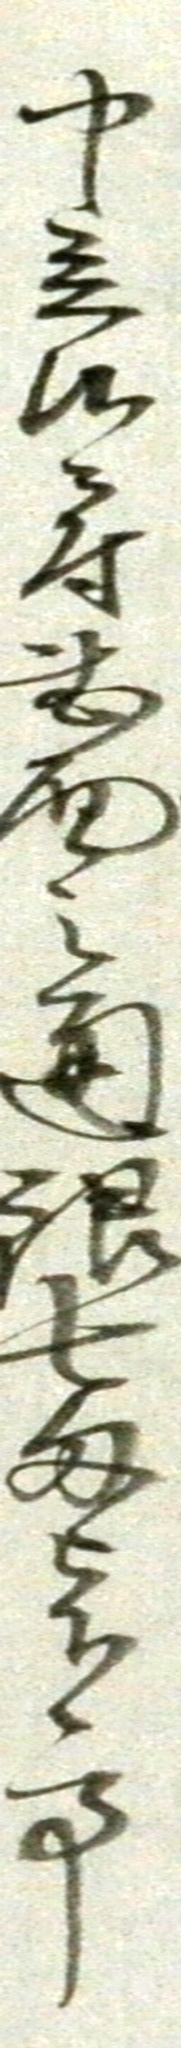申立候ニ付書面之通銀七匁被下候事
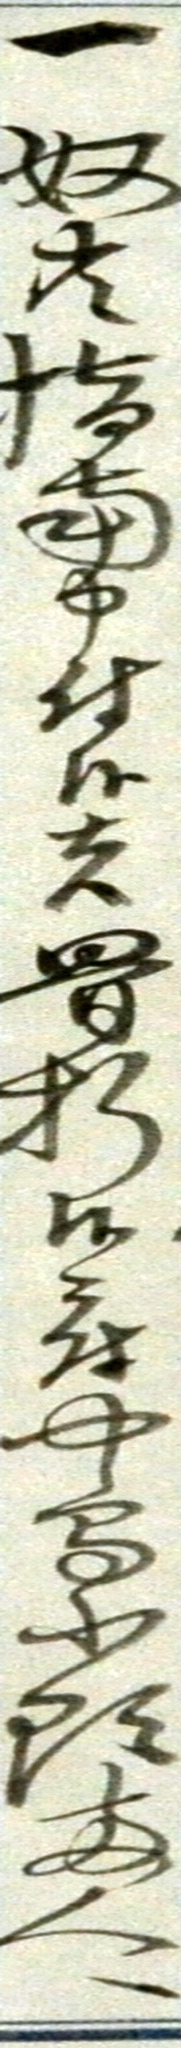一奴共指南申付候者骨折候ニ付中間小頭両人へ
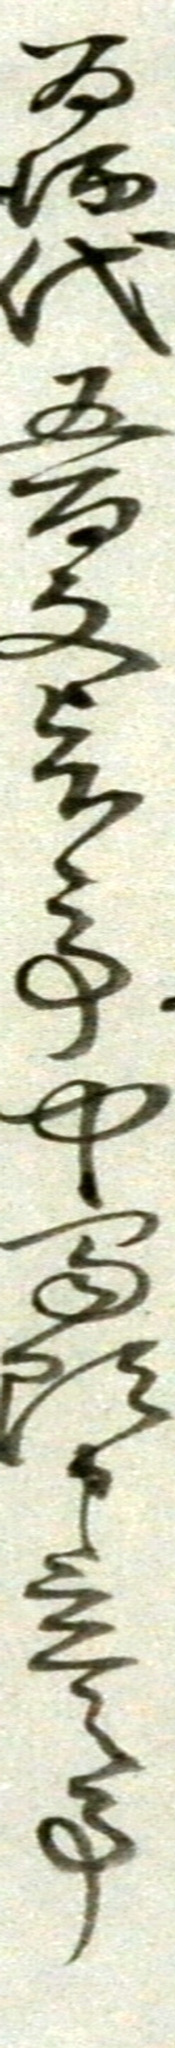為酒代五百文被下候事中間頭申立候事
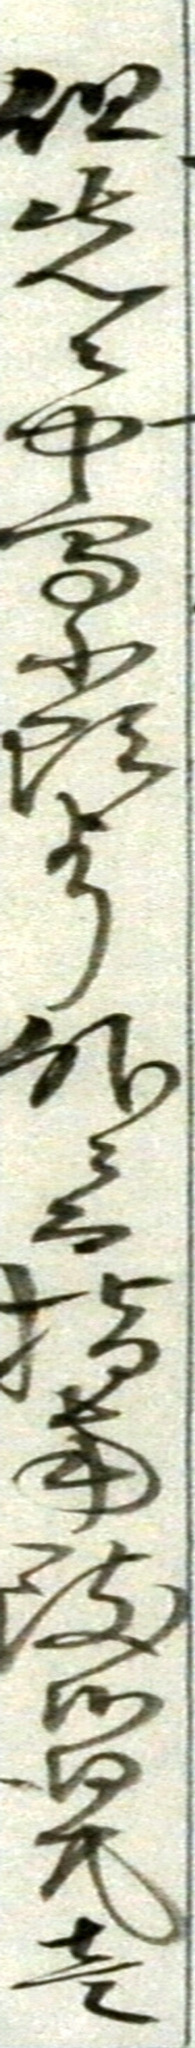但先々中間小頭より外ニ而指南致候得共壱
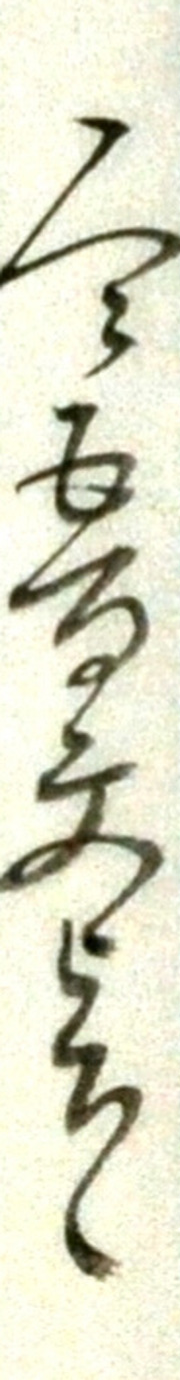人ニ五百文被下候
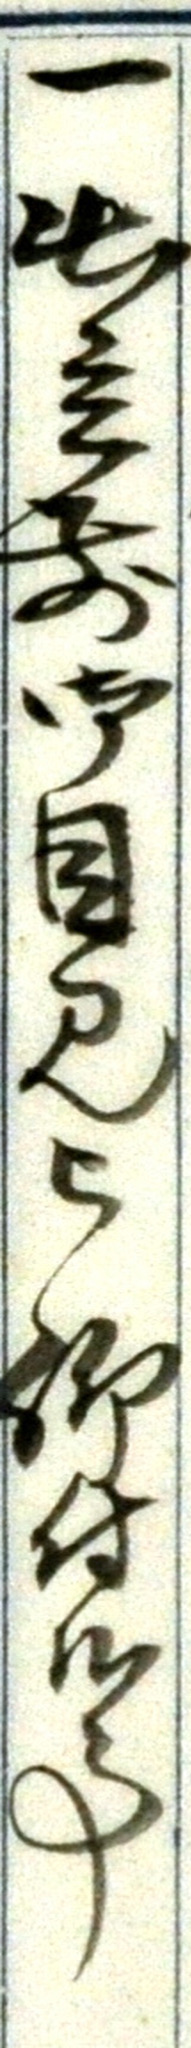一出立前御目見被仰付候事
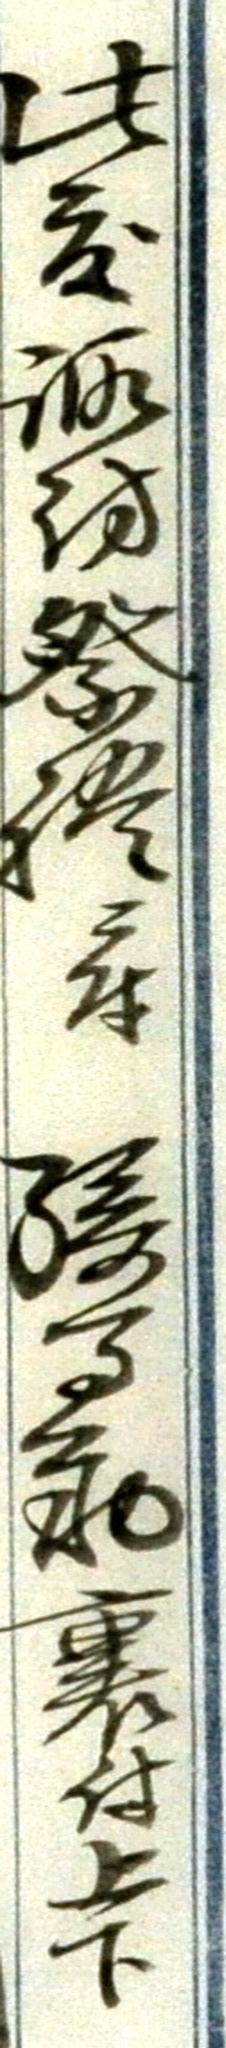此度諏訪祭礼ニ付騎馬勤裏付上下着
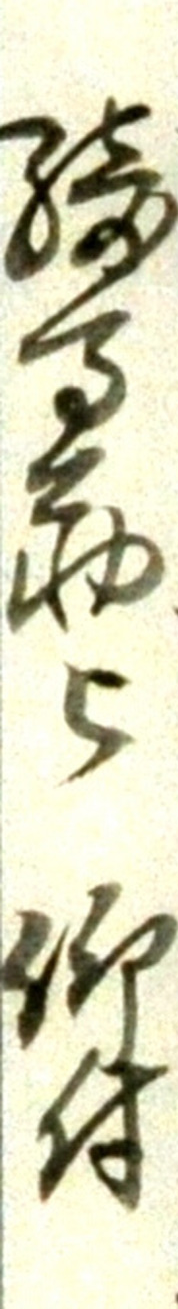騎馬勤被仰付
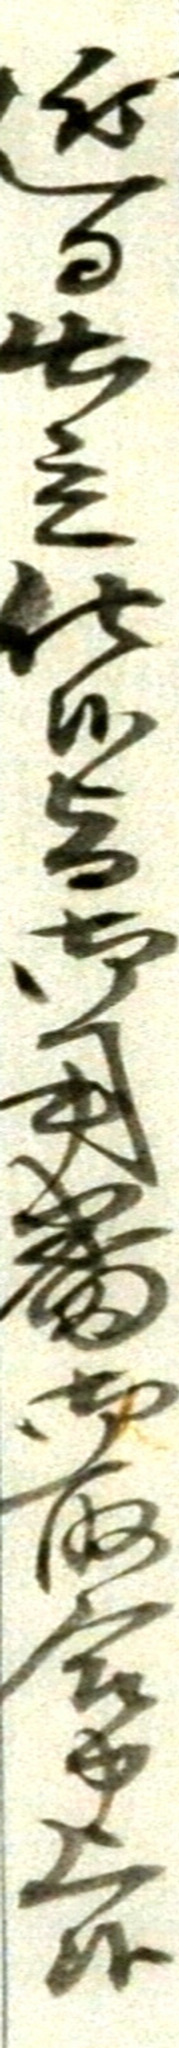近日出立仕候旨御用番御取合申上候
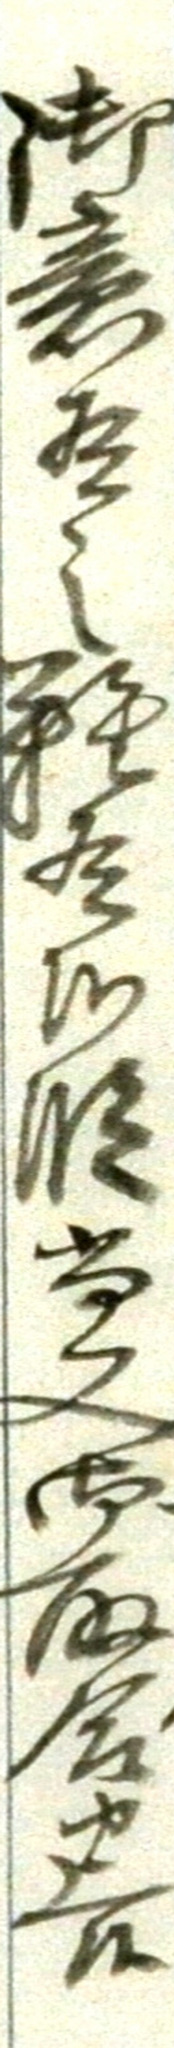御意有之難有候段尚又御取合申上候
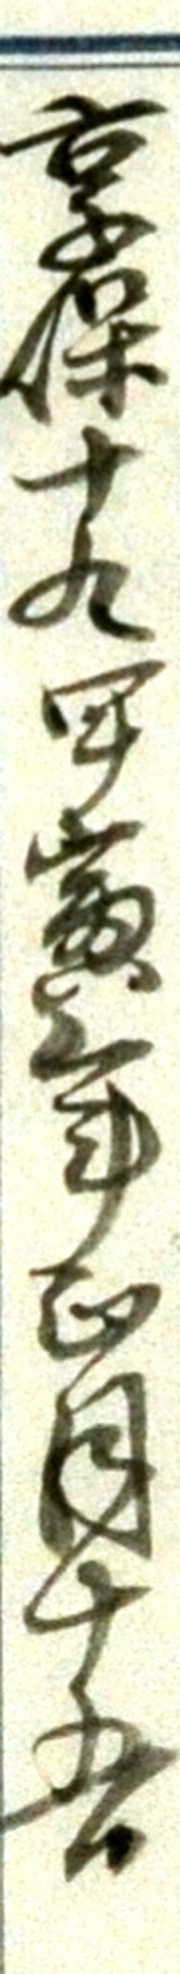享保十九甲寅年正月十五日
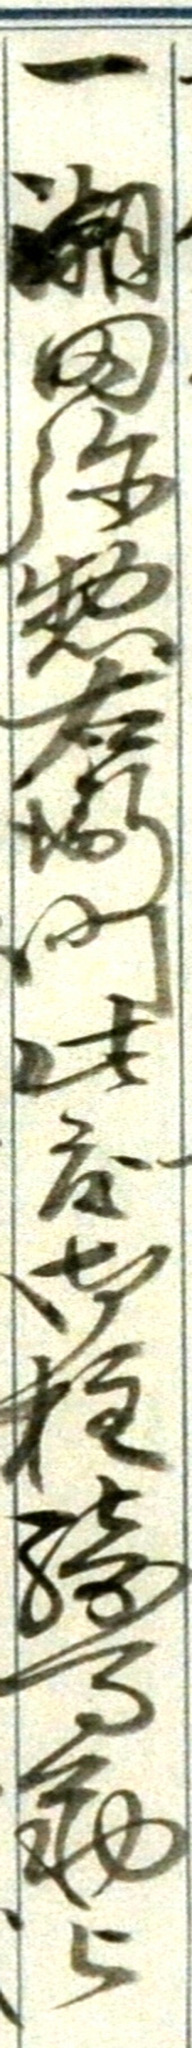一潮田弥惣右衛門此度御柱騎馬勤被
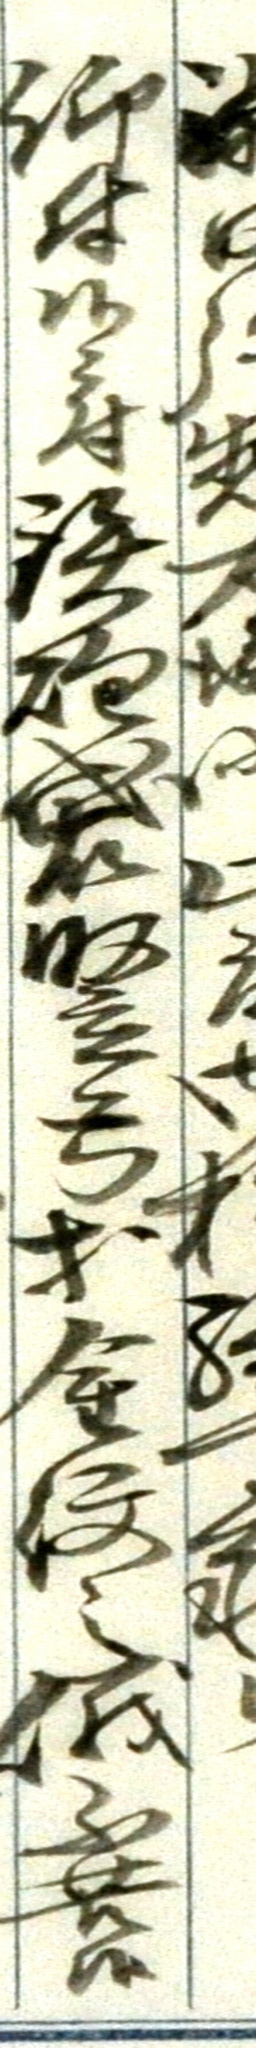仰付候ニ付鉄炮袋竪弓等金紋之儀不苦候
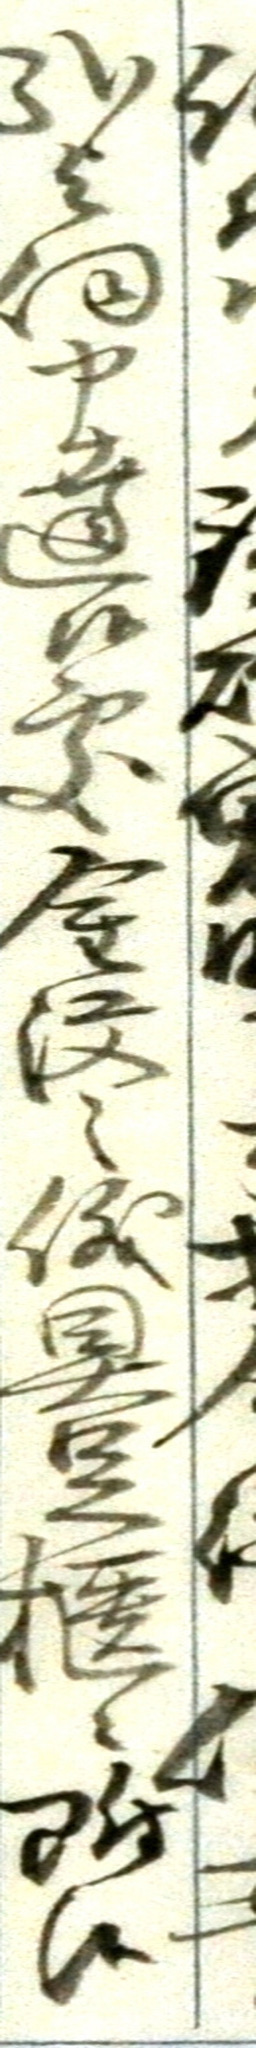哉と伺申達候処金紋之儀具足櫃ニ附候
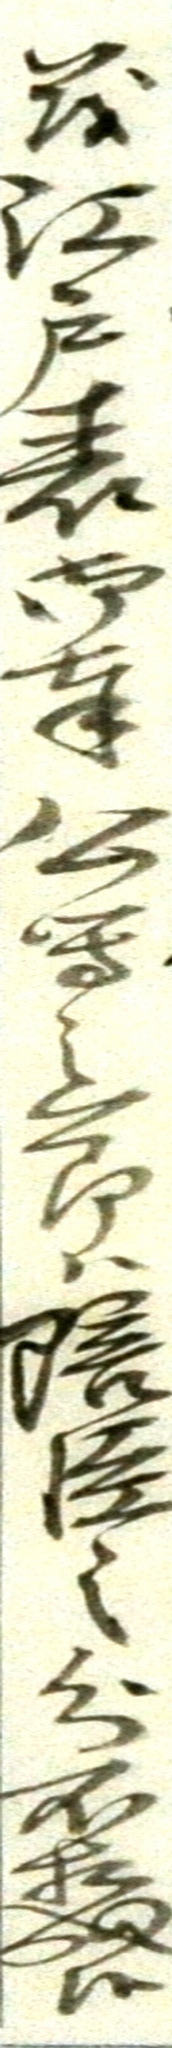も江戸表御奉公等之節ハ陪臣之分不相成候
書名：諏訪御柱祭之節・騎馬大将御中間頭・御柱引人足
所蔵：伊那市立高遠町図書館・合同会社AMANE
